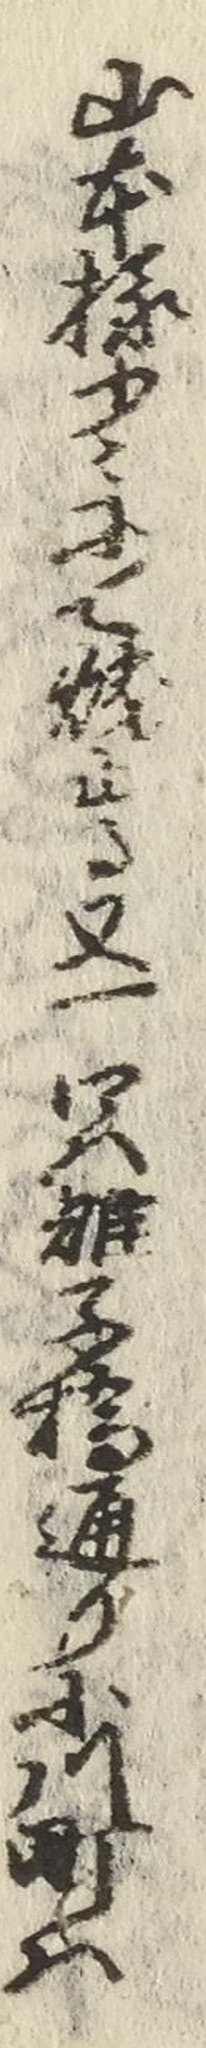山本様少々にて焼止る又一口は雉子橋通り小川町は
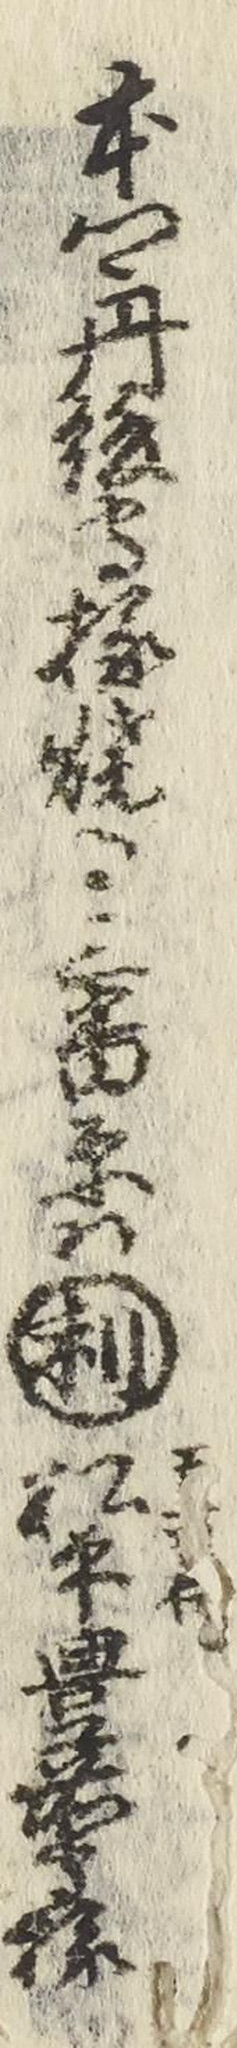本郷丹後守様焼る三番原は五万石松平豊前守様
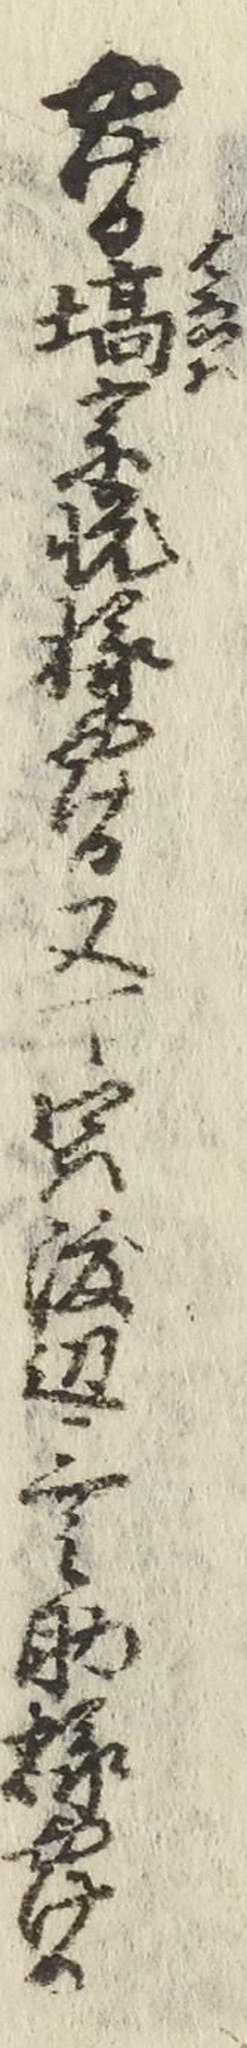やける塙宗悦様やける又一ㇳ口は渡辺三之助様やける
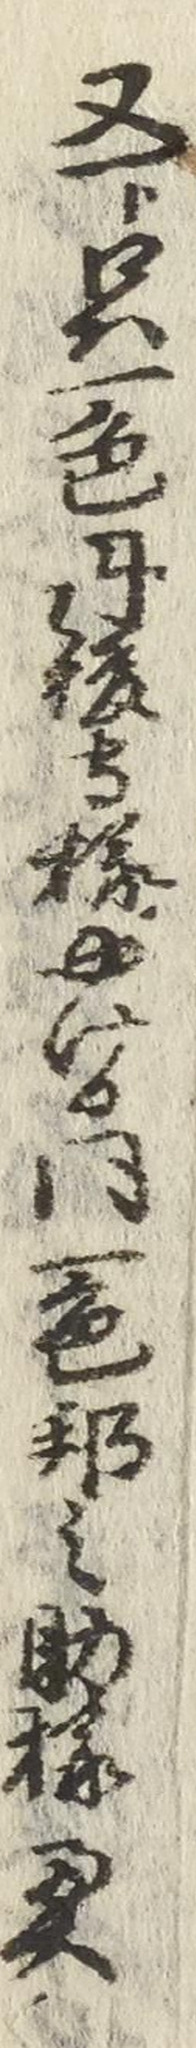又一ㇳ口は一色丹後守様やける同一色邦之助様奥
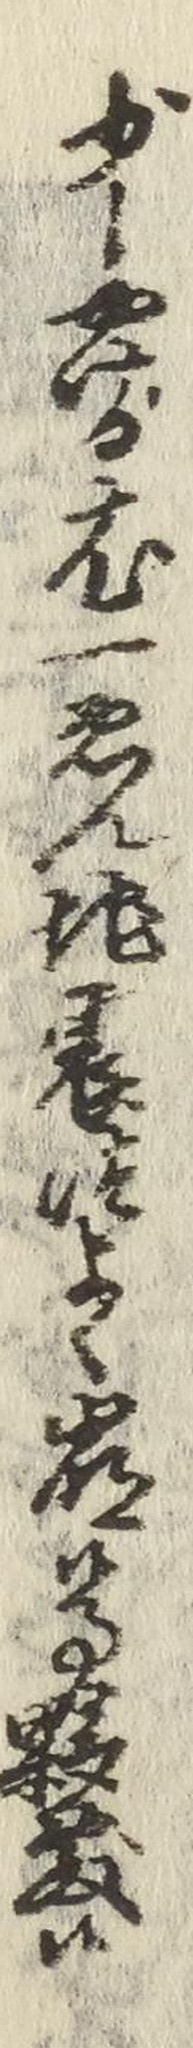少しやける尤一ゑん地震つよく崩候事夥敷候
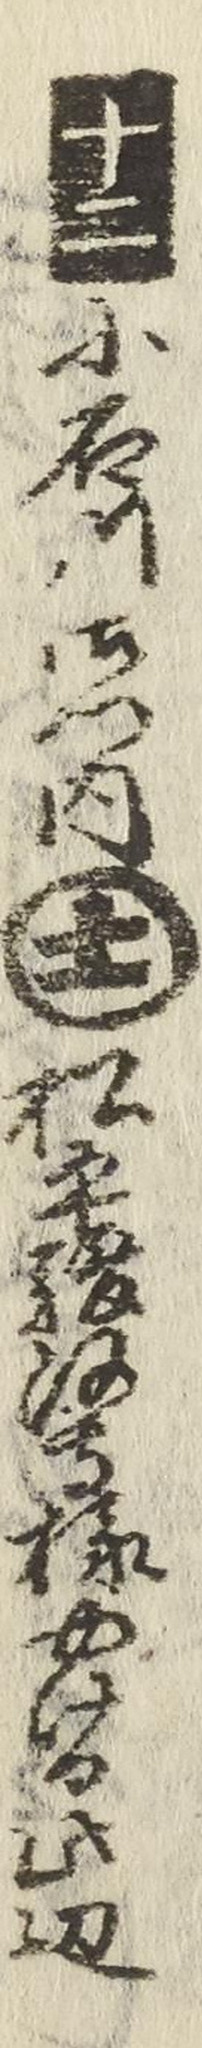十二小石川御門内松平駿河守様やける此辺
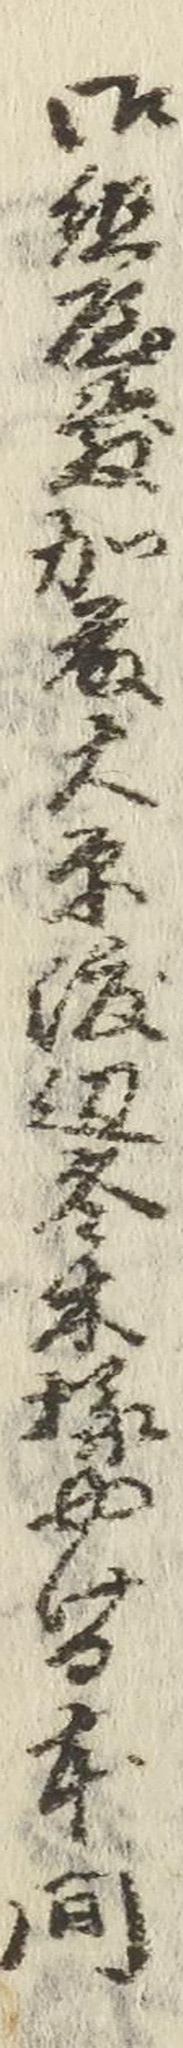御組屋敷加藤大原渡辺冬木様やける本間
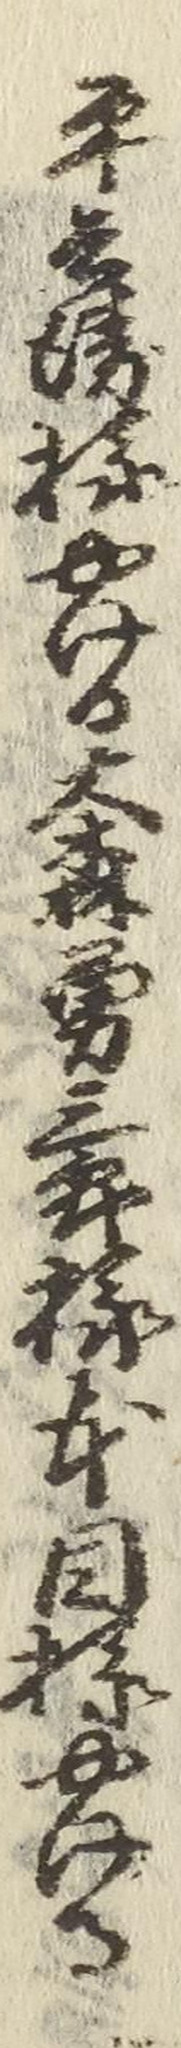平兵衛様やける大森勇三郎様本目様やける
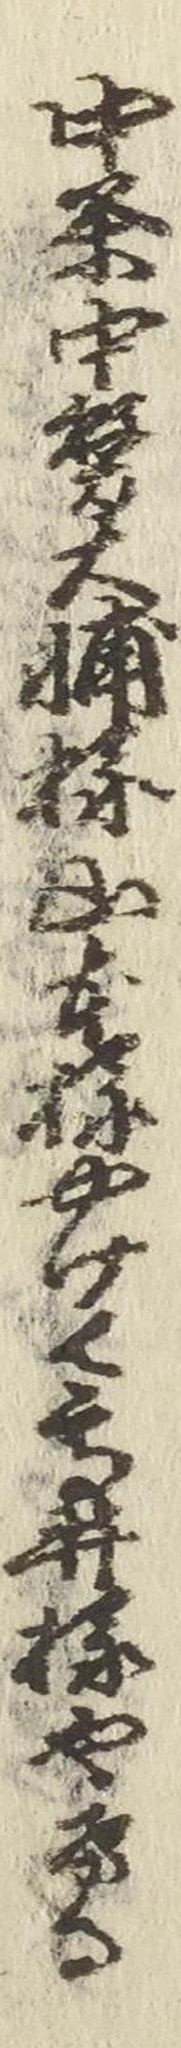中条中務大輔様山本様やけて高井様やける
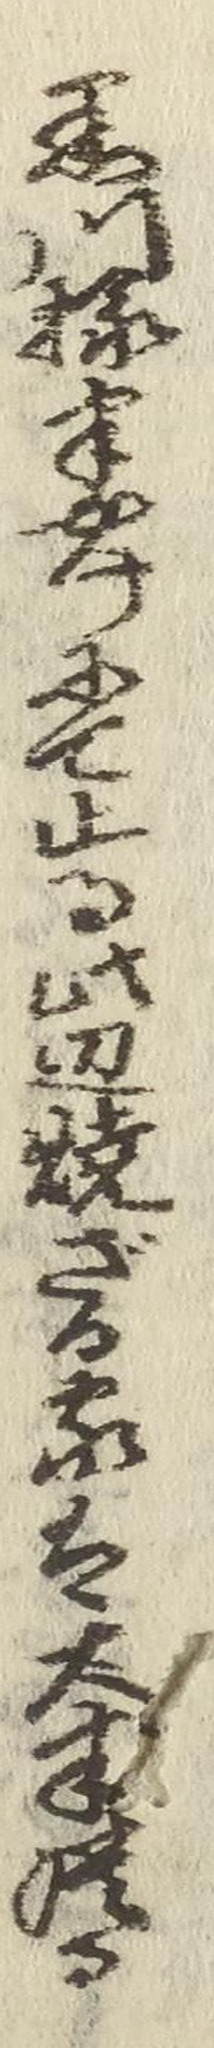黒川様半焼にて止る此辺焼ざる家は大半潰る
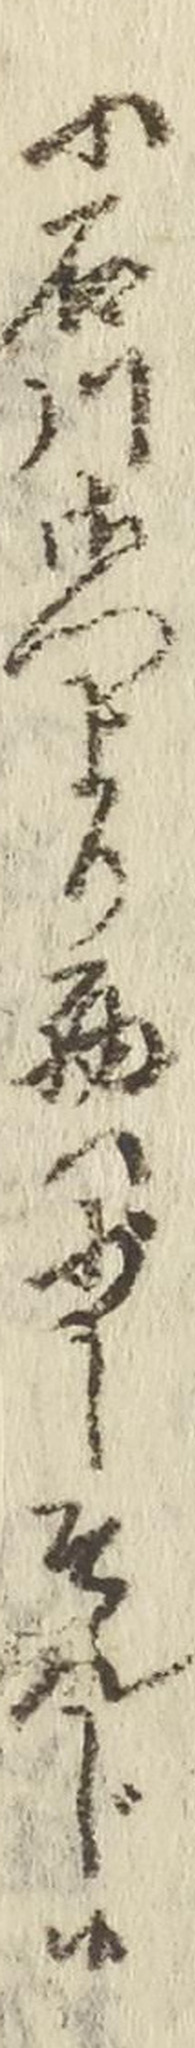小石川御門より西は少しそんじ候
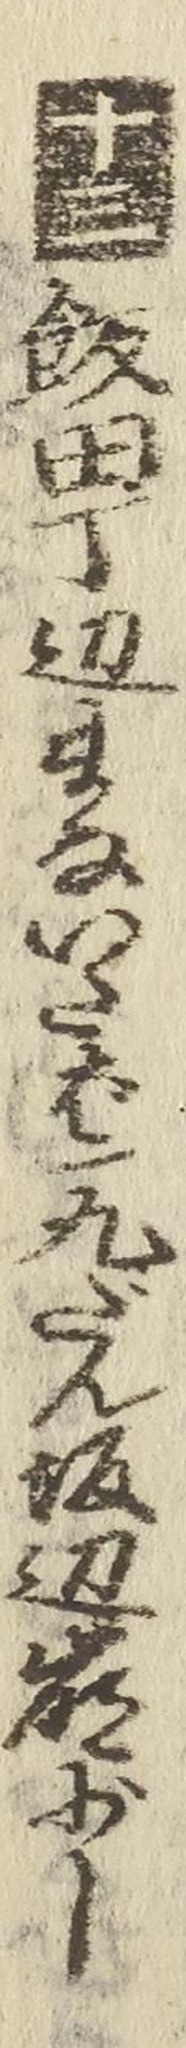十三飯田丁辺まないたば九だん坂辺崩少し
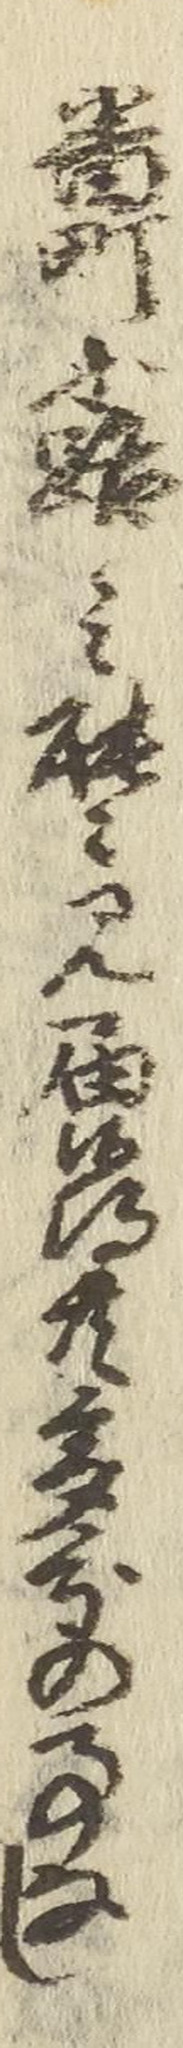番町小路々能々見届候得共多分の事なし
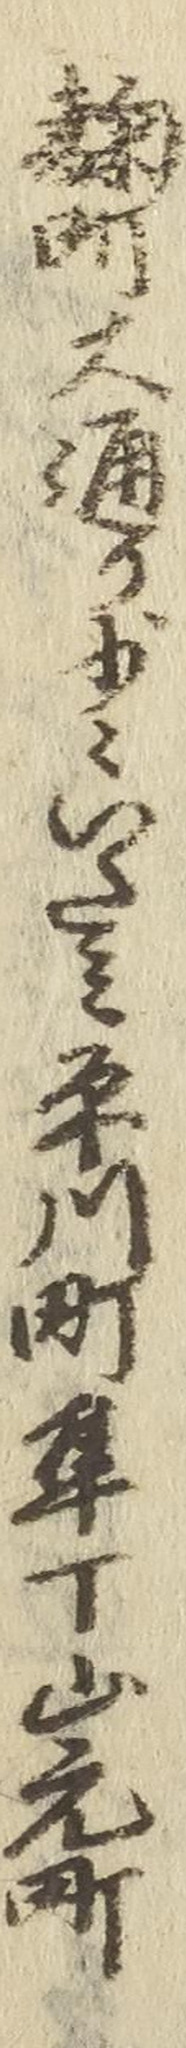麹町大通り少々いたみ平川丁隼丁山元丁
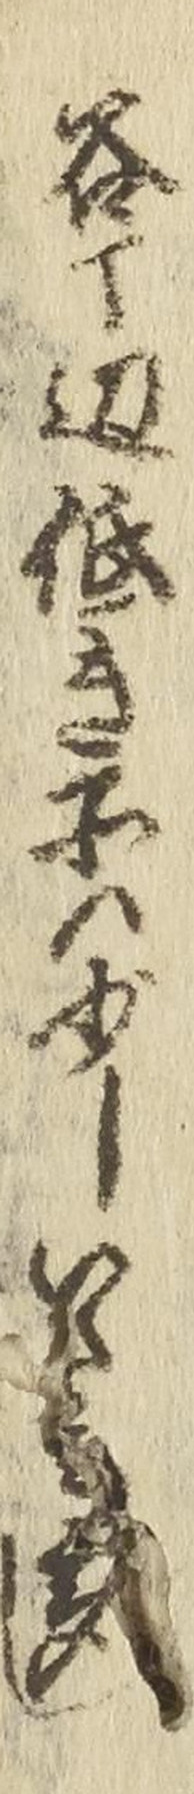谷丁辺低き所は少しいたみ多し
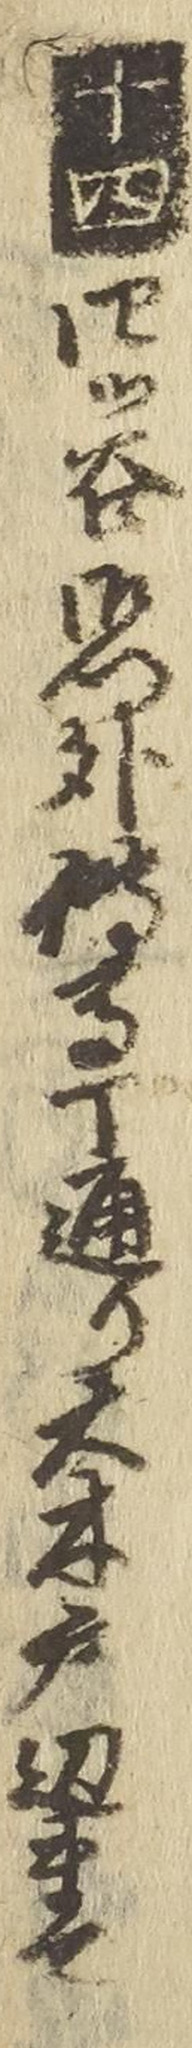十四四ッ谷御門外伝馬丁通り大木戸辺まで
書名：地震出火　男女死人怪我人書上之寫
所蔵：東京大学地震研究所図書室 Earthquake Research Institute Library, The University of Tokyo, JAPAN
